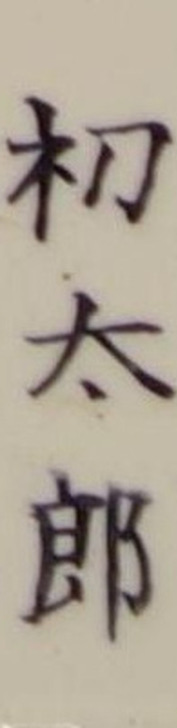初太郎
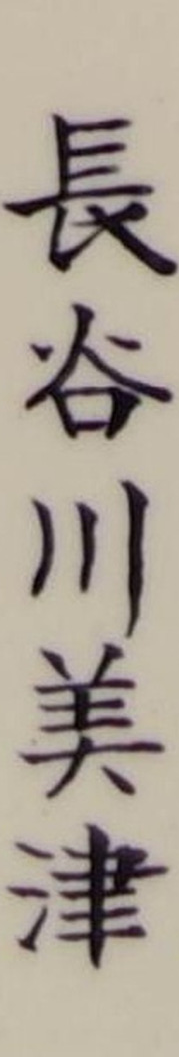長谷川美津
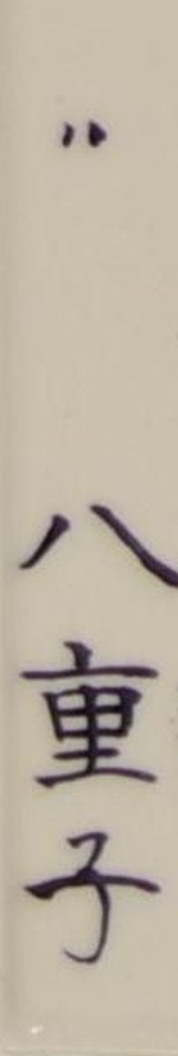八重子
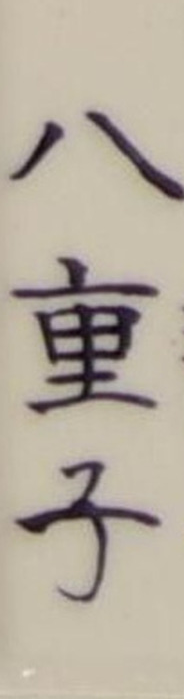八重子

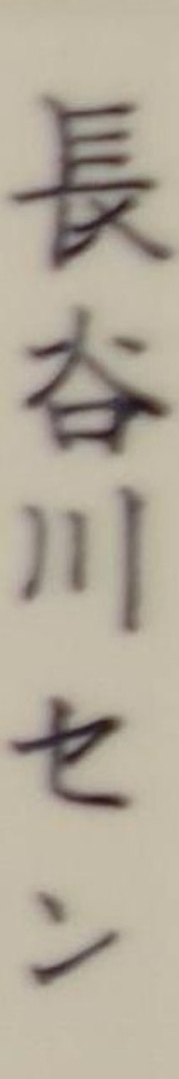長谷川セン
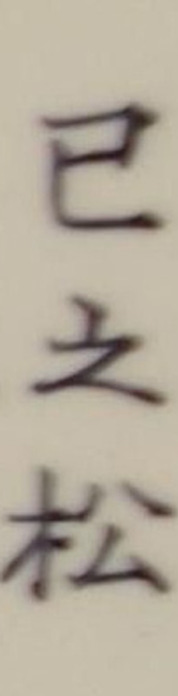巳之松
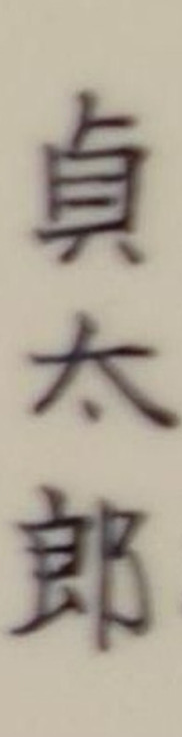貞太郎
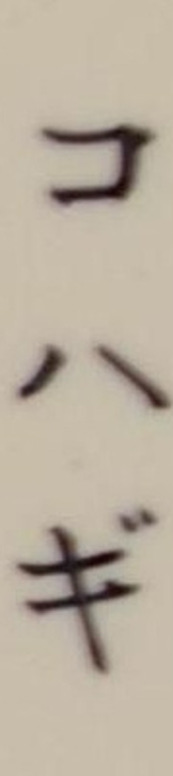コハギ
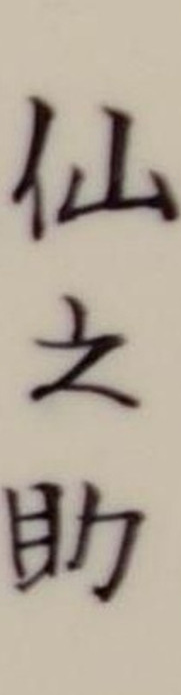仙之助
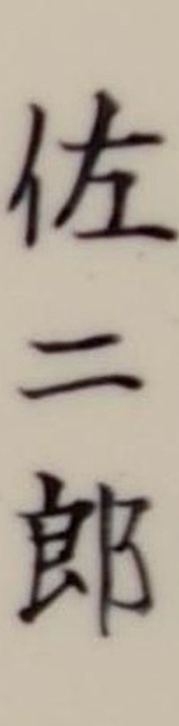佐二郎
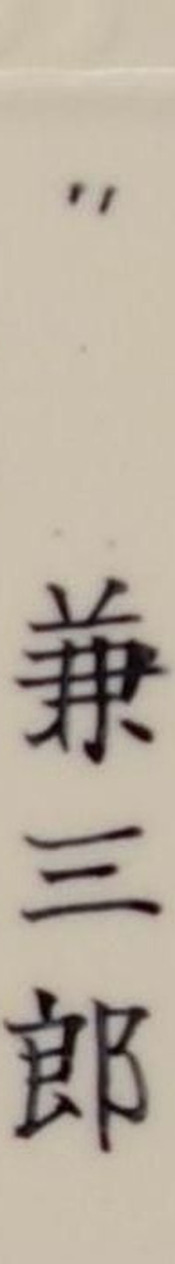兼三郎
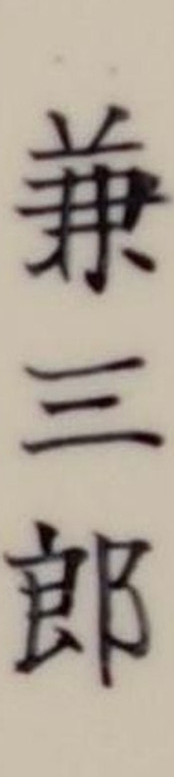兼三郎
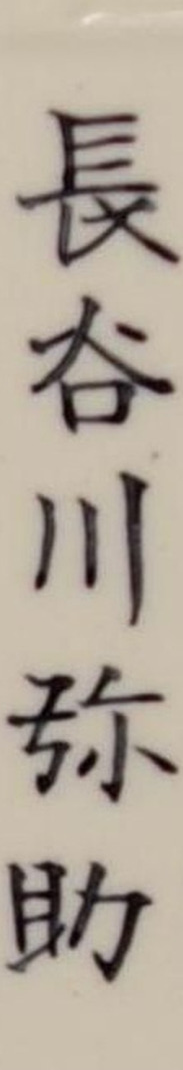長谷川弥助
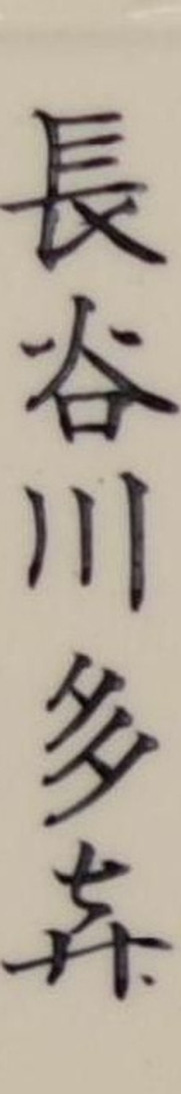長谷川多喜
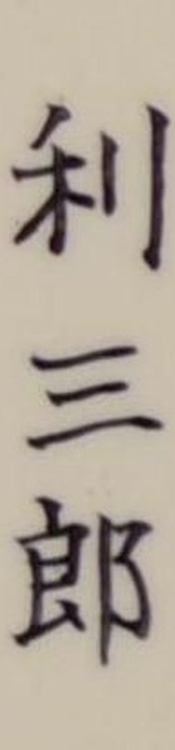利三郎
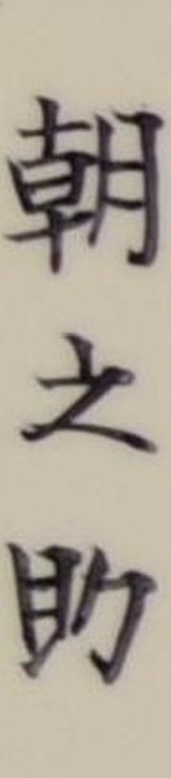朝之助
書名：M~S
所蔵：高野山金剛峯寺
